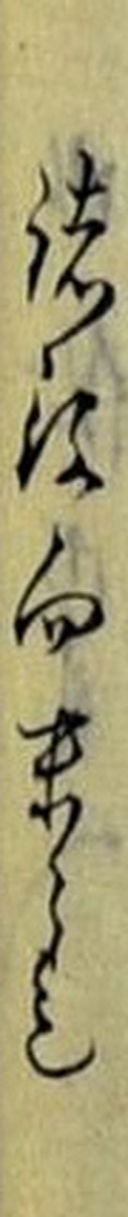諸役向末々迄
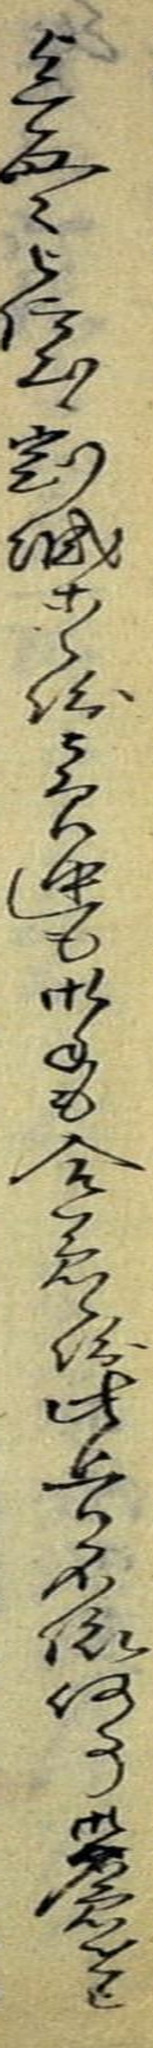迄毎々被仰出候割減等之儀に而は迚も御手も合兼候儀此上は不依何事御廉を被
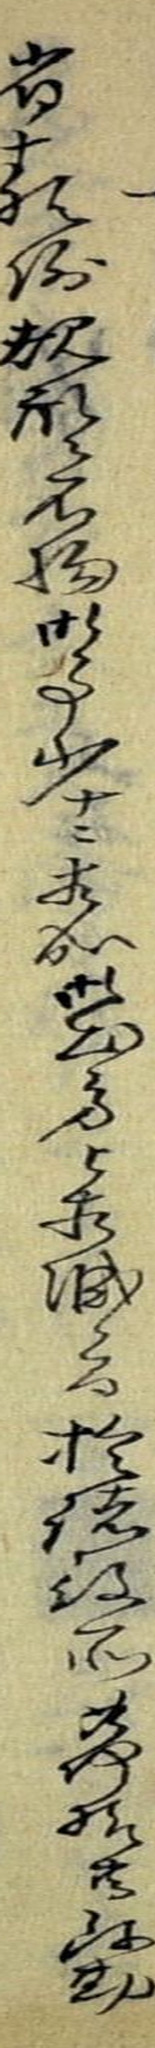省類例規形に不拘御事少なに相成御出方被相減候間於諸役所如何様共致勘
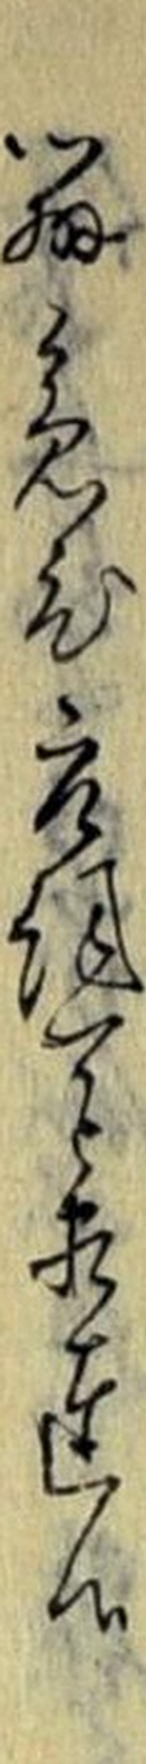弁急度取調可被相達候
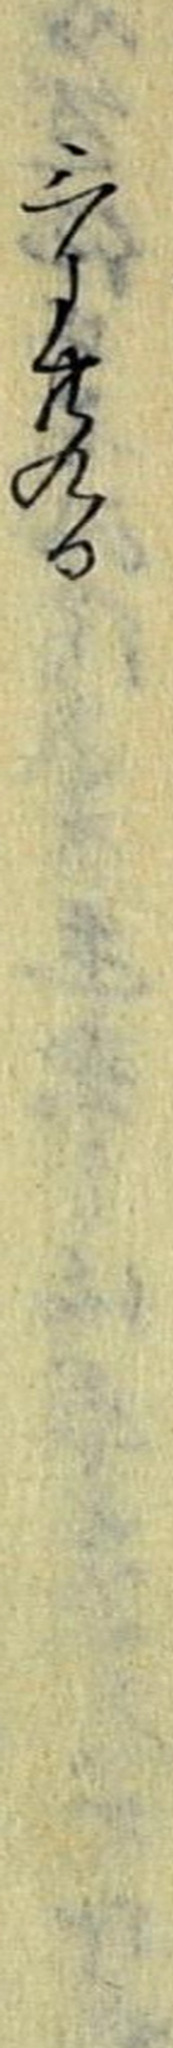三月廿九日
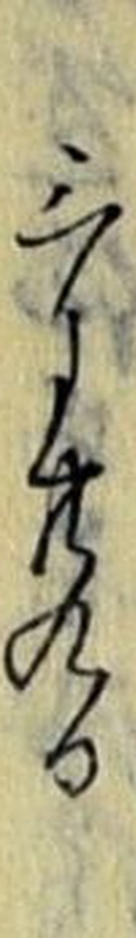三月廿九日
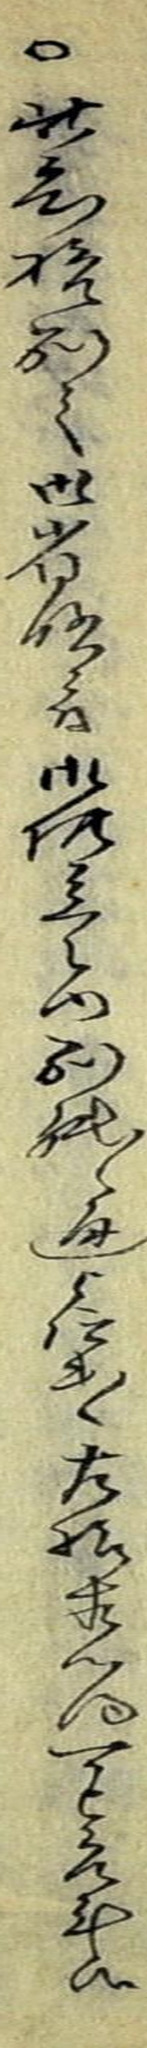○此度格別之御省略に付御供立之内別紙之通被仰出候左様相心得可被取斗候
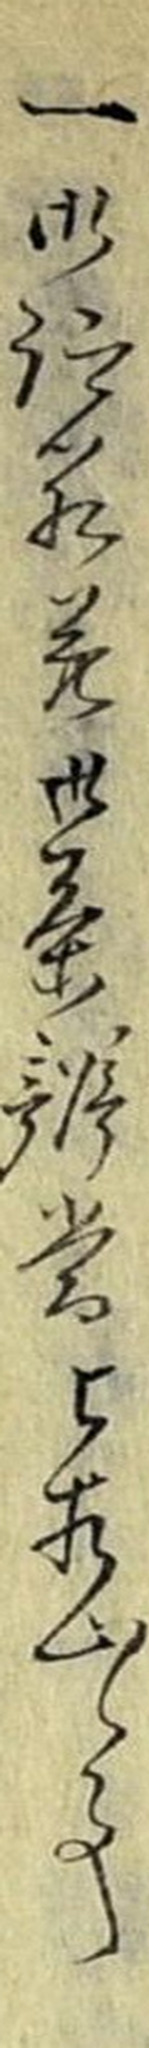一御跡箱并御茶弁当被相止候事
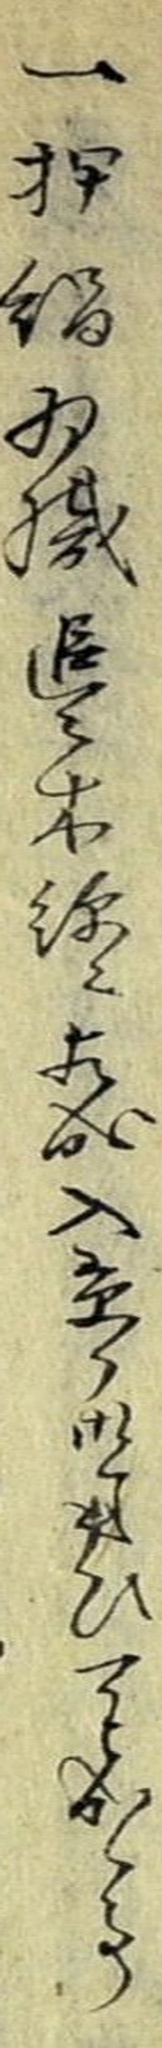一押絹羽織追々木綿に相成入交り御用ひ可被成候事
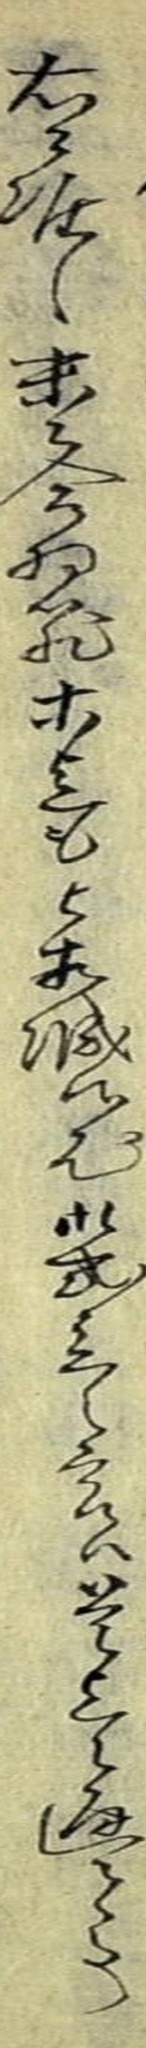右に准し末々合羽蔵駕籠迄も被相減候尤御式立之節は是迄之通に候事
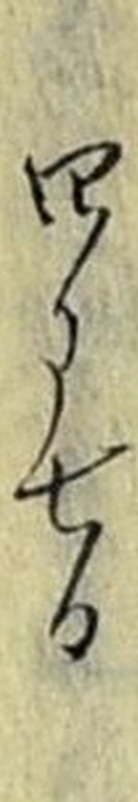四月七日
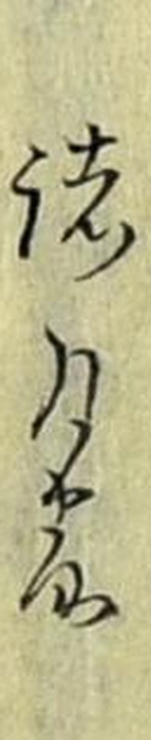諸月番
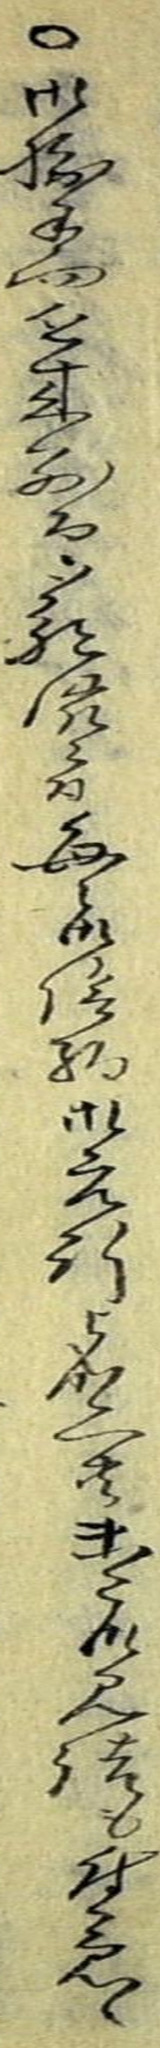○御勝手向近来別而御難渋に付毎々御倹約御取行被成候へ共未た御見詰も付兼候
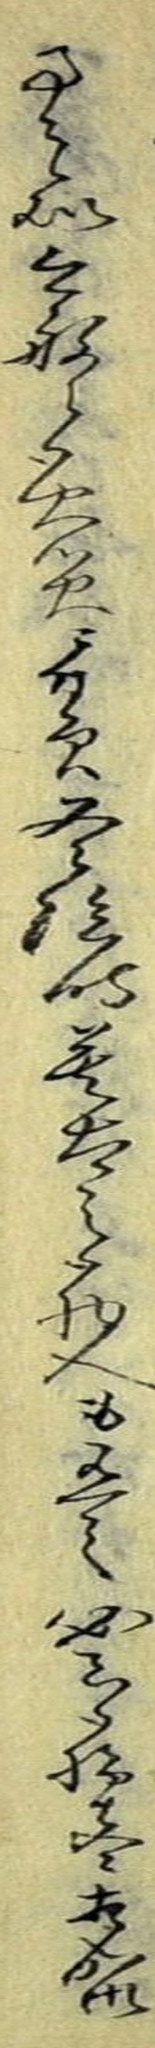事に候処今般之御火災に付而は又々臨時莫太之御物入も有之必至御指支に相成御

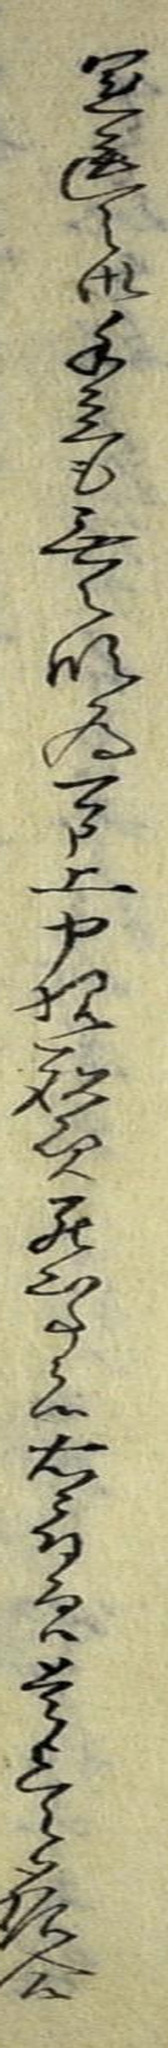運達之御手立も無之段為可申上中根靭負罷出事に候右に付而は是迄之御振合
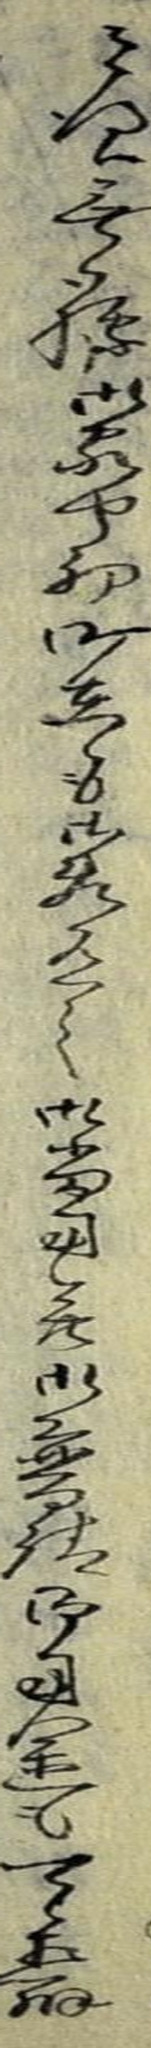に候得は無御拠御家中初町在へも御頼有之御当用并御普請御用途も可被相弁
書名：命令之部 六
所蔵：福井県文書館 Fukui Prefectural Archives
